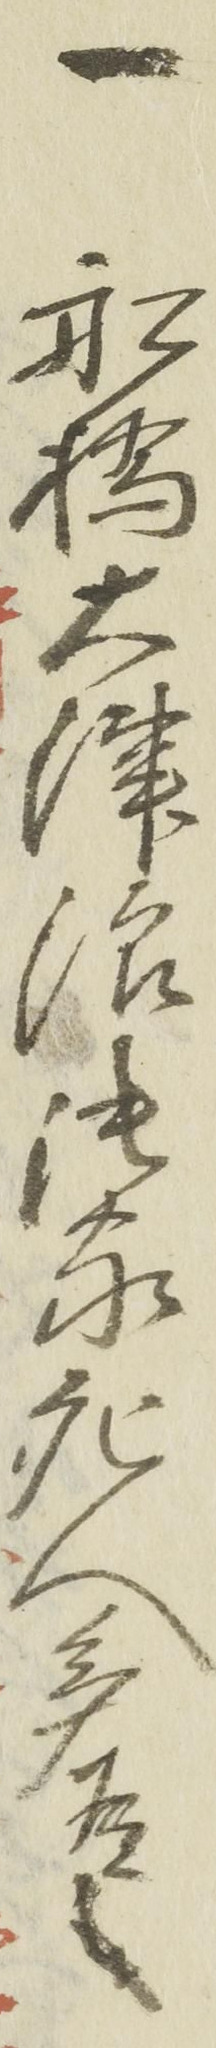一船橋大津浪潰家死人多有之
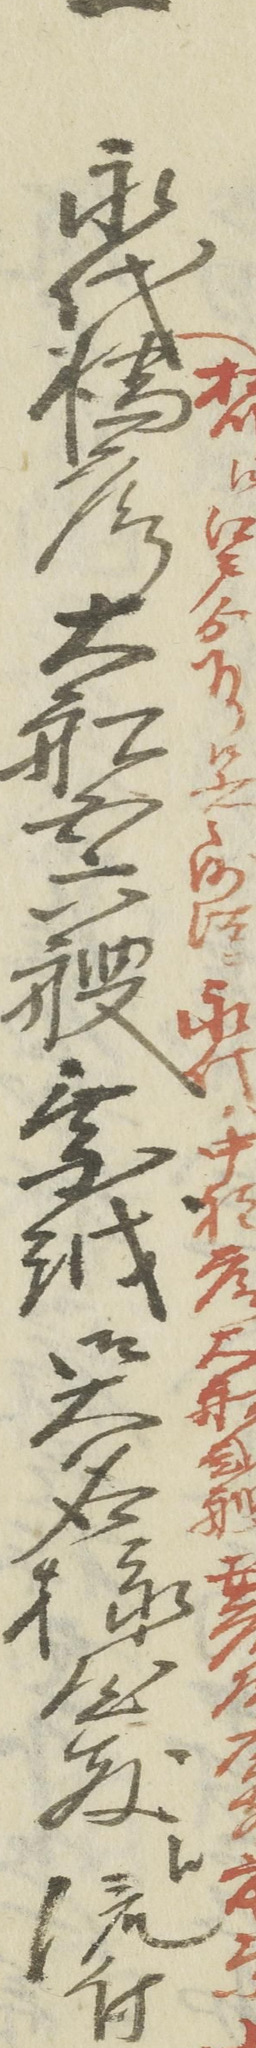一永代橋落大船五六艘乗越御大名様屋敷江流付
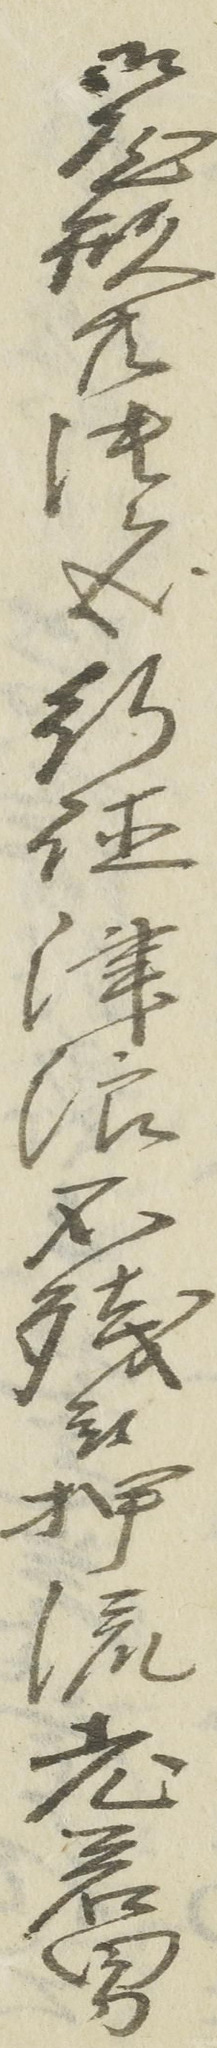御屋形共潰候成行徳津浪不残被押流老若男
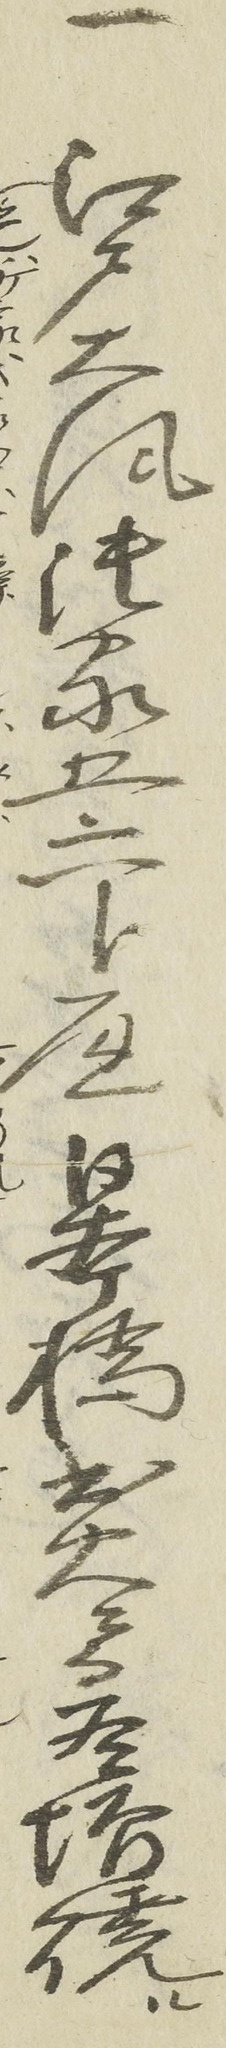一江戸大風潰家五六分通日本橋出火ニ而有増焼ル
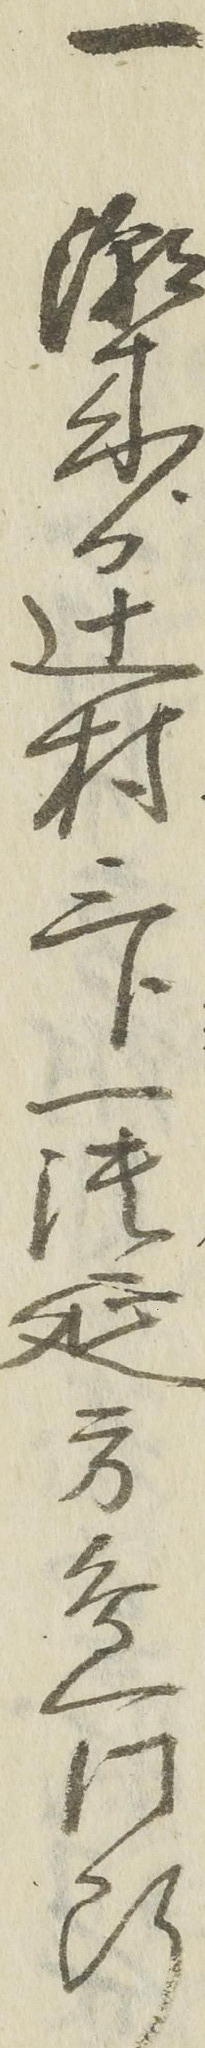一潮来ゟ辻村三分一潰延方辺同断
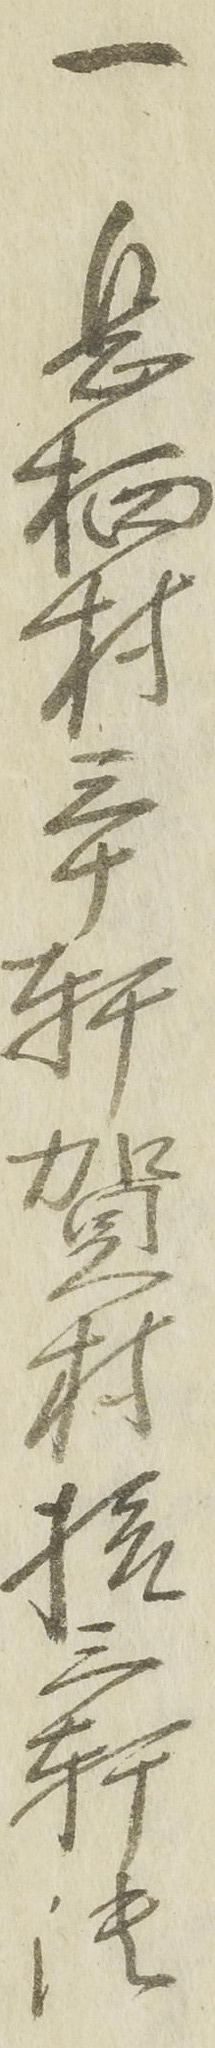一息栖村三十軒賀村拾三軒潰
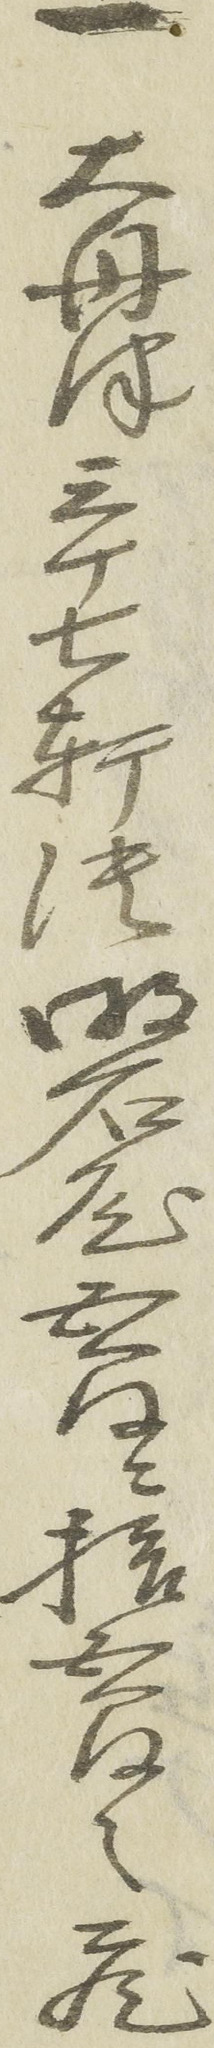一大舟津三十七軒潰明石屋五間に拾五間之蔵
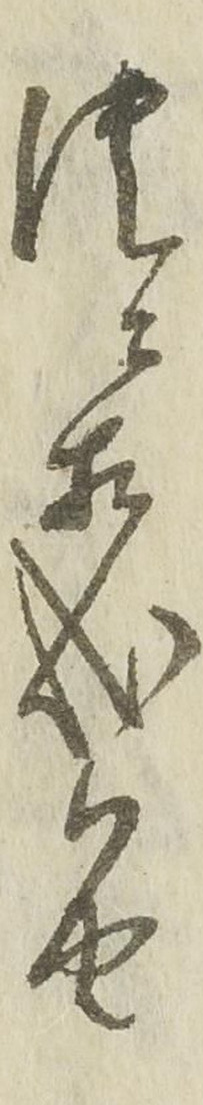潰ニ相成候由

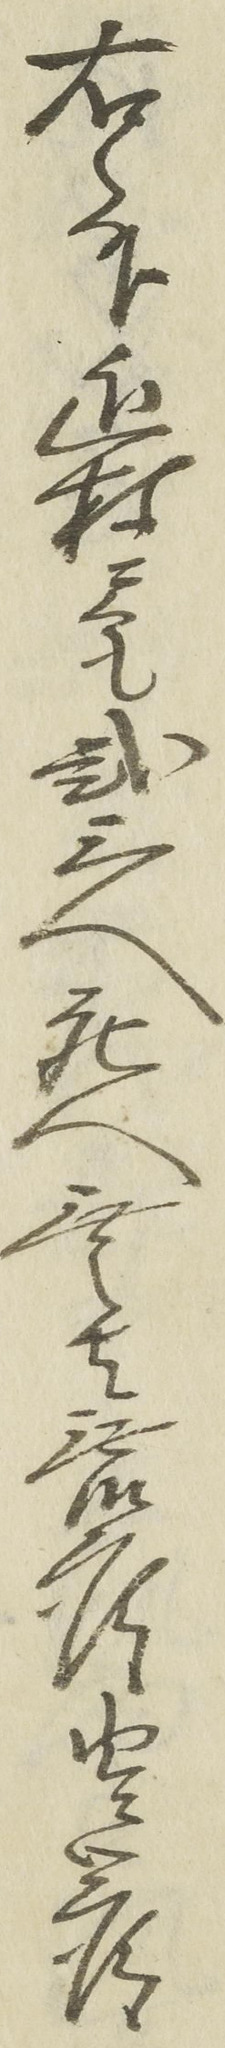右之外近村ニ而も弐三人死人無之は無御座候由ニ御座候
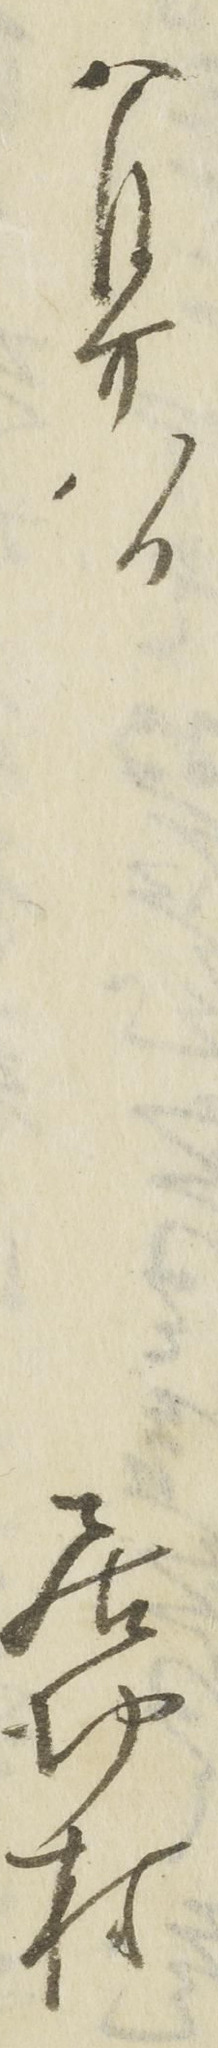八月廿八日居切村
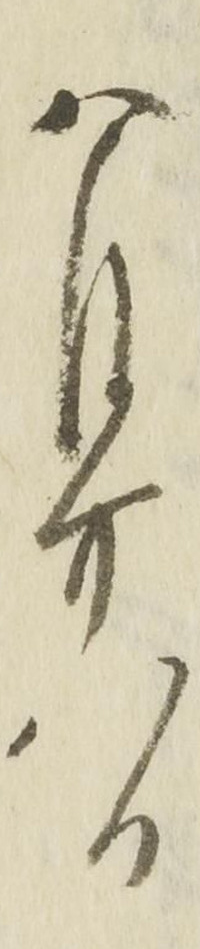八月廿六日
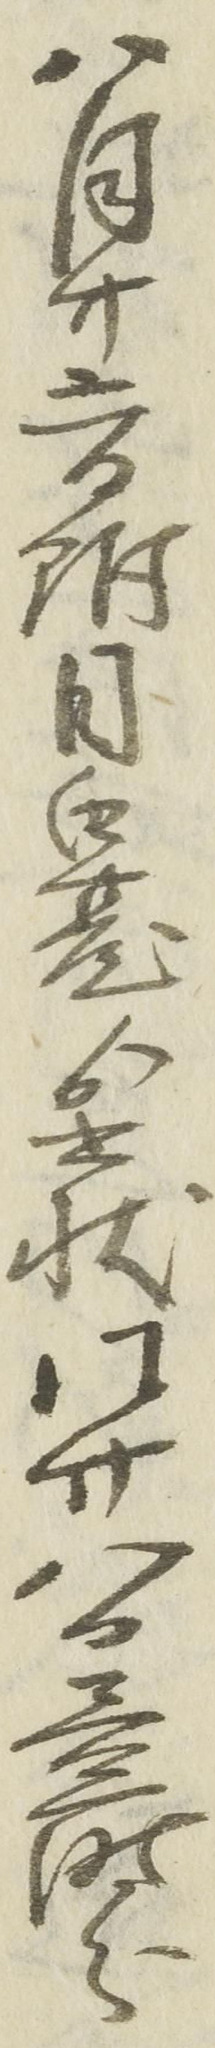八月廿六日附目白台ゟ書状同廿八日昼時分
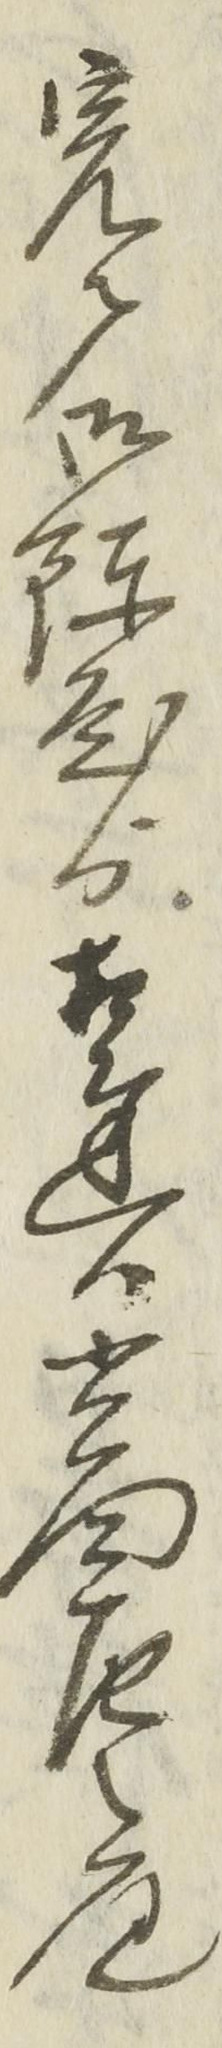充ニ御陣屋ゟ相達候書面左之通
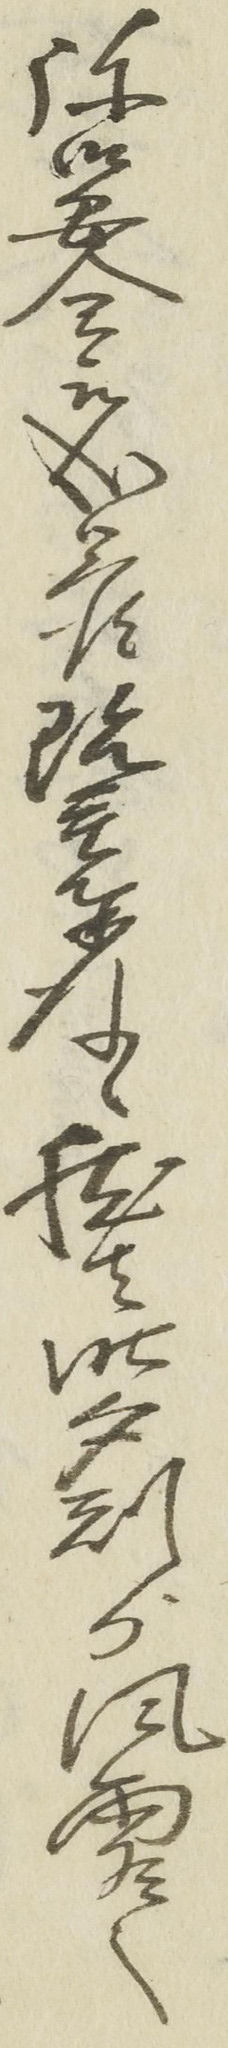弥御安全被成御座候珍重奉存候然は昨夕刻ゟ風雨有之
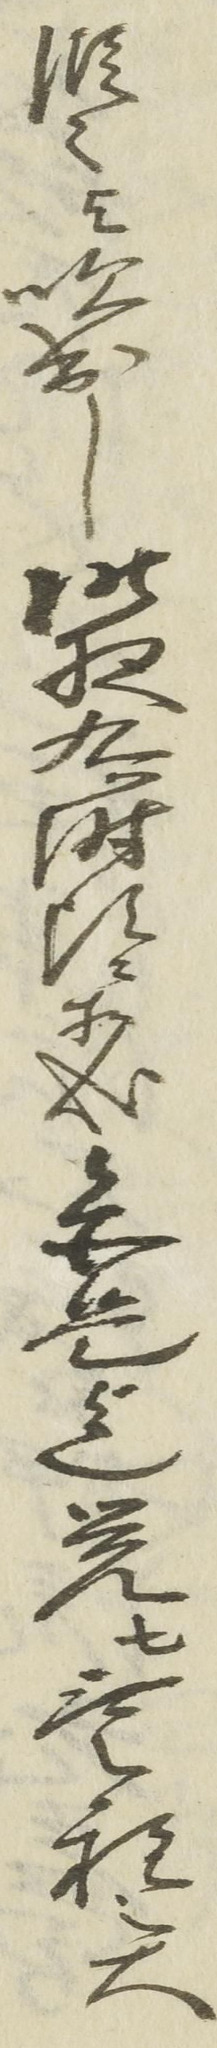段〻と吹出し昨夜九ツ時比ニ相成候所是迄覚も無之程之大
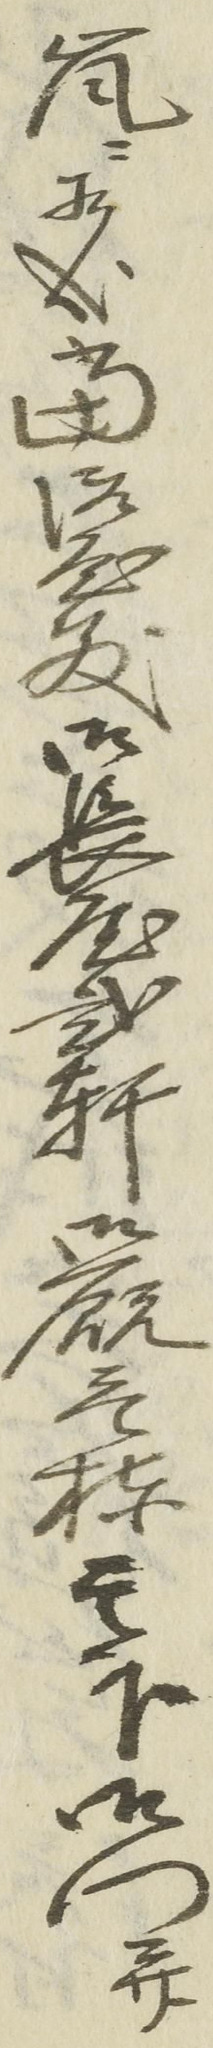嵐ニ相成当御屋敷御長屋弐軒御厩壱棟其外御門并
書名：安政乙卯江戸大地震筆記　安政丙辰八月大阪大雷雨之記追加　安政三辰年七月松前辺大地震并八月大風雨記録
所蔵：東京大学地震研究所図書室 Earthquake Research Institute Library, The University of Tokyo, JAPAN
